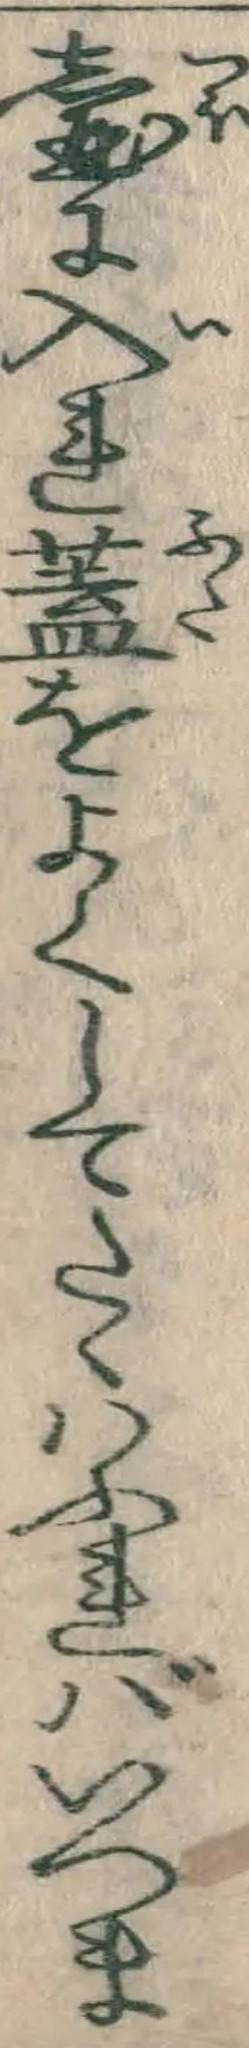壺に入れ蓋をよくしてたくはふればいつま
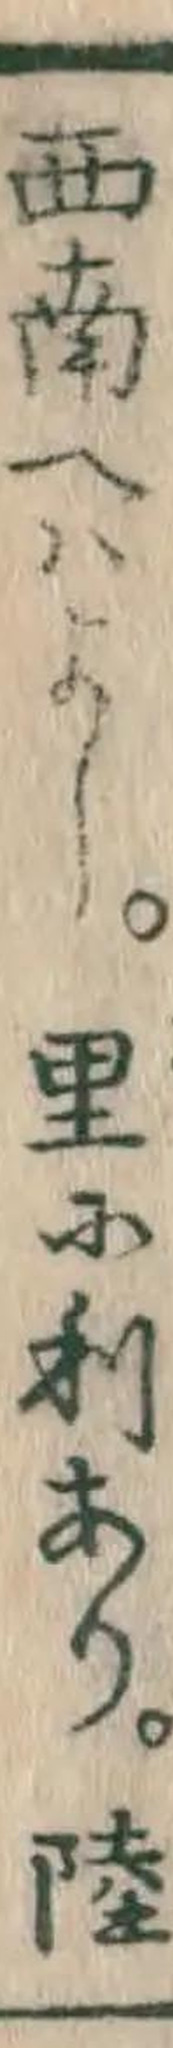西南へはよし。里に利あり。陸
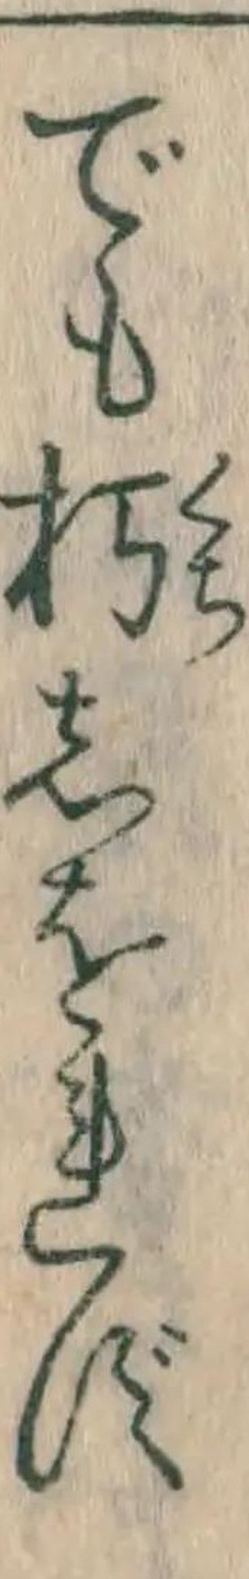でも朽しをれず

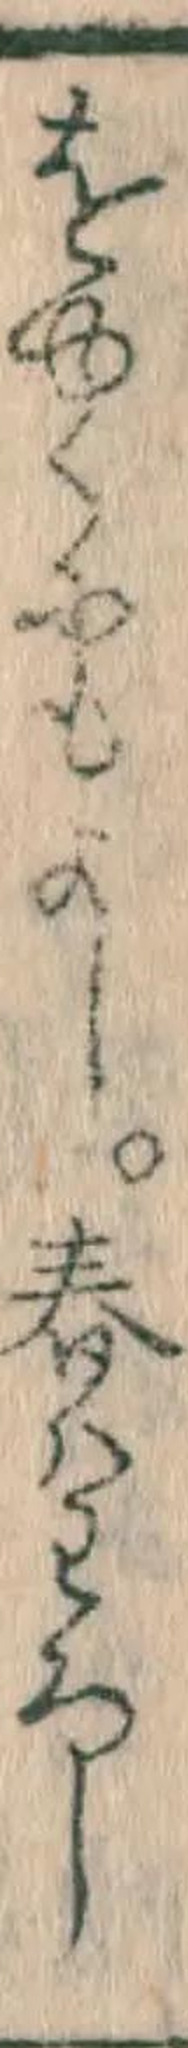をゆくにもよし。春はわろし
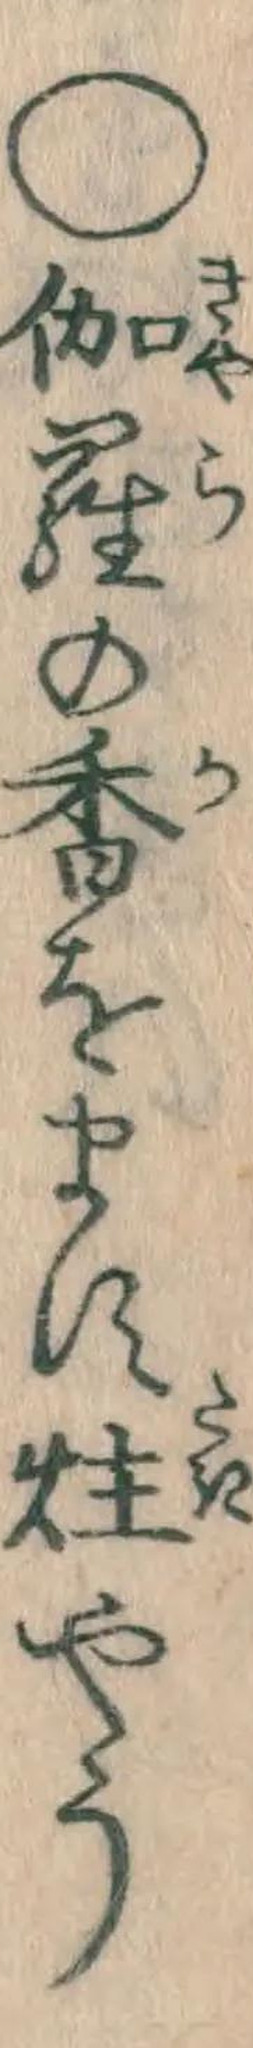○伽羅の香をます炷やう
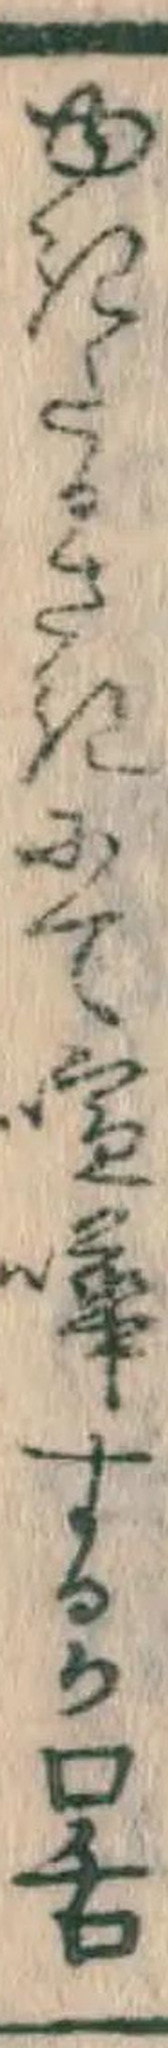ゆきたるさきにて喧嘩するか口舌
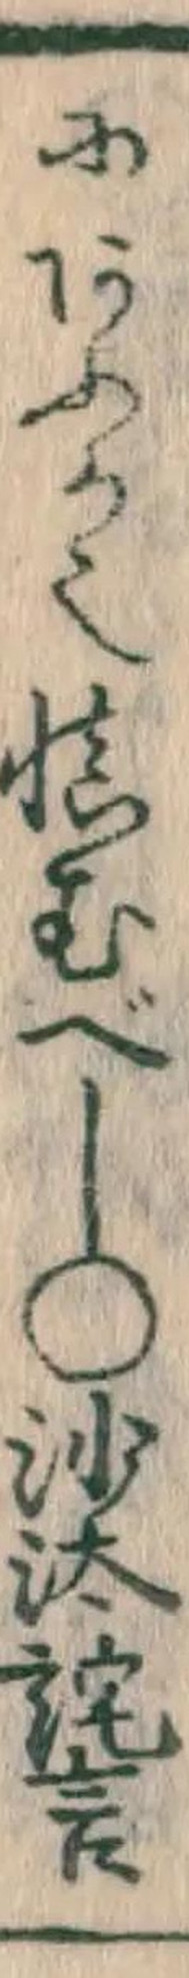にあふか也慎むべし○沙汰詫言
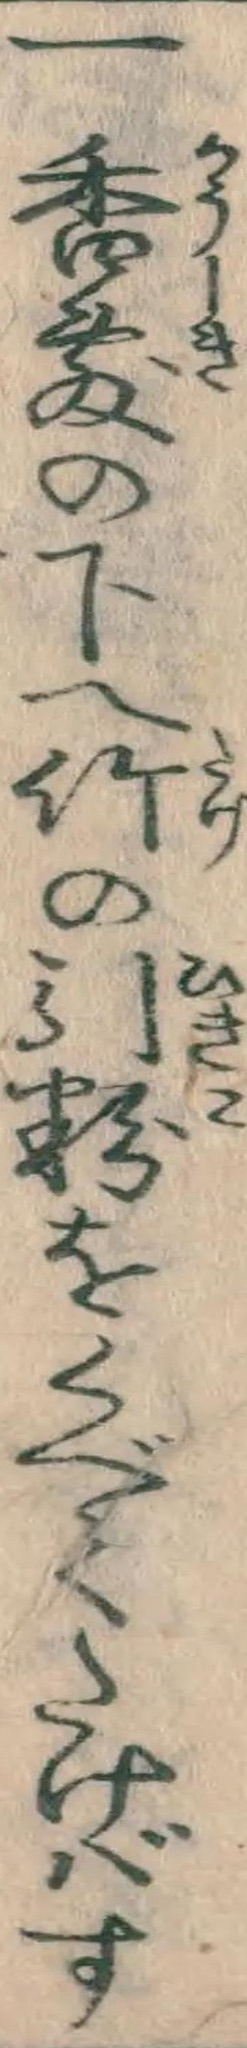一香敷の下へ竹の引粉をくべてたけばす
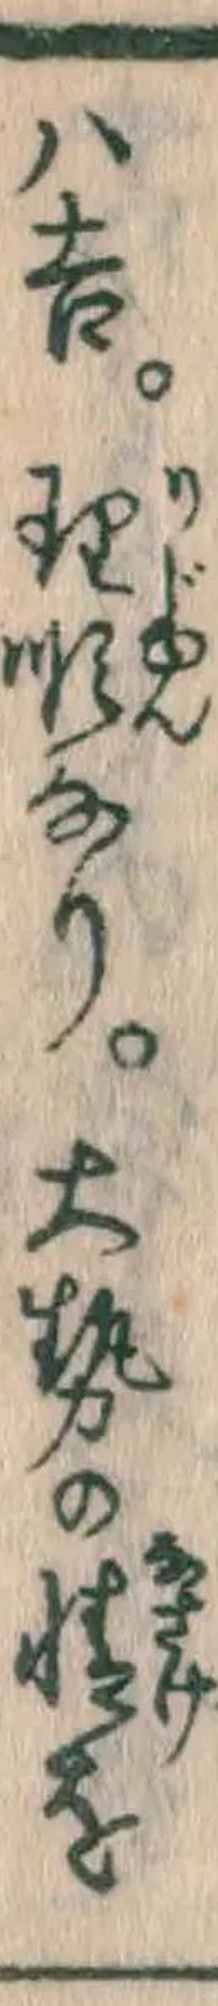は吉。理順なり。大勢の情を
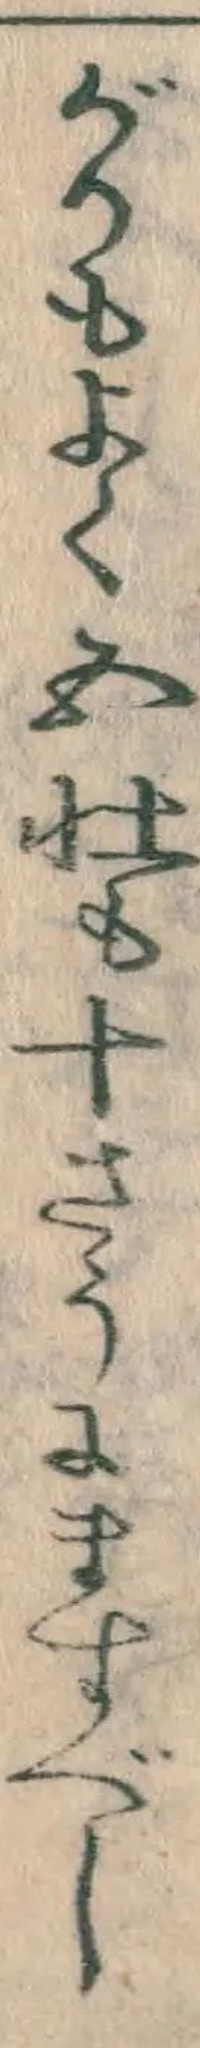がりもよく五壮も十さうにますべし
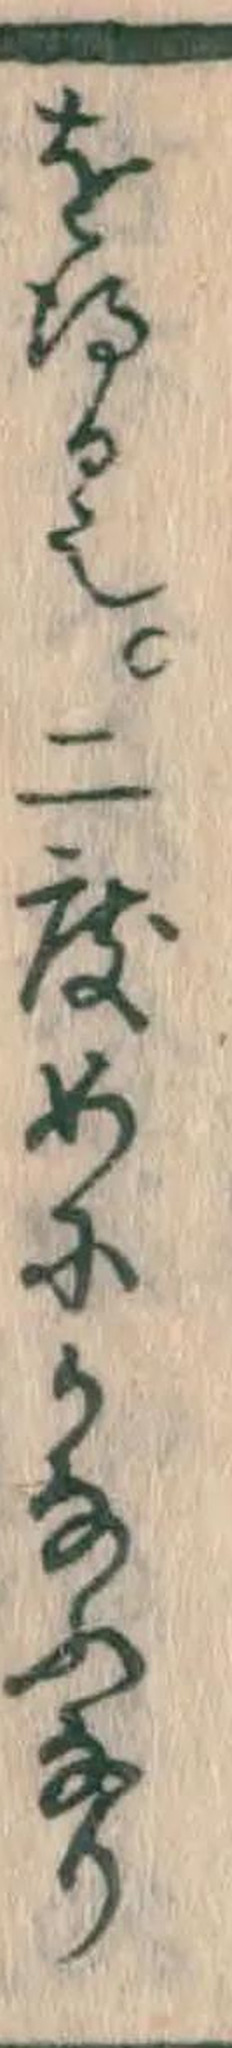を得る也。二度めにかなふなり
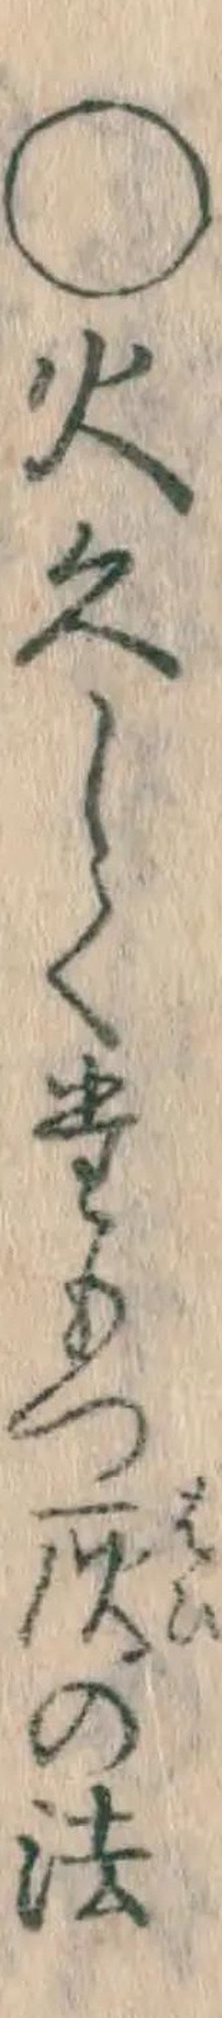○火久しくたもつ灰の法
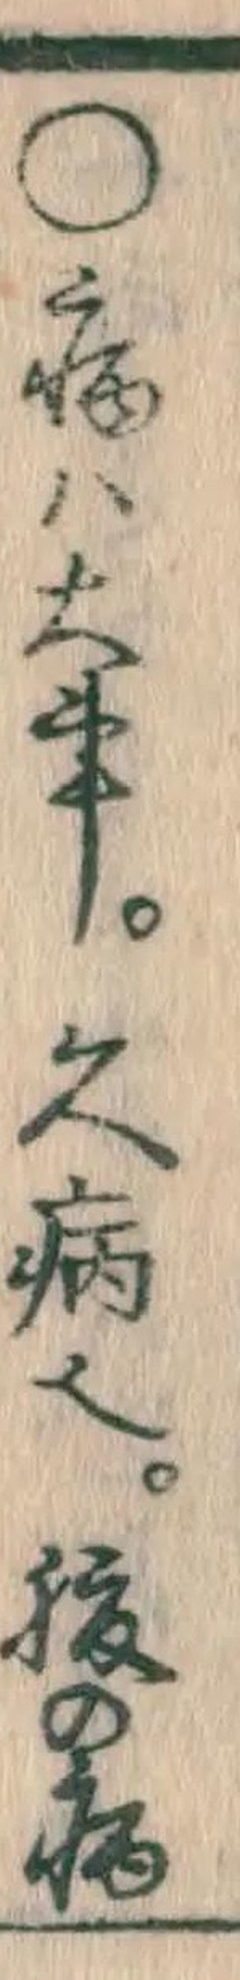○病は大事。久病也。腹の病
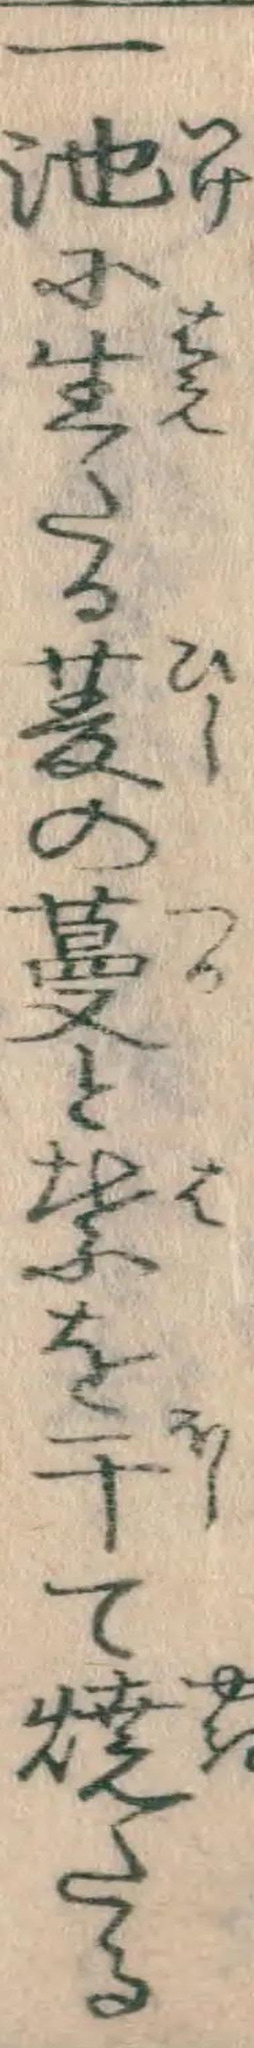一池に生たる菱の蔓と葉を干て焼たる
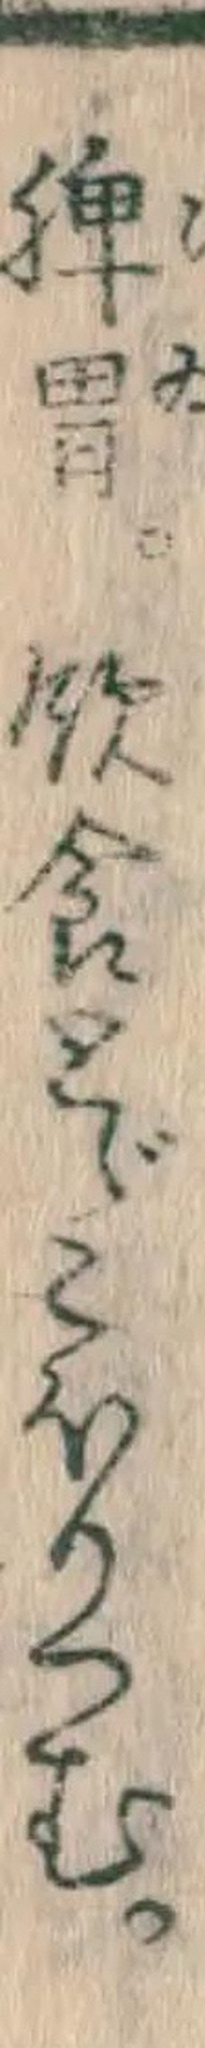脾胃。飲食とゞこほりつむ。
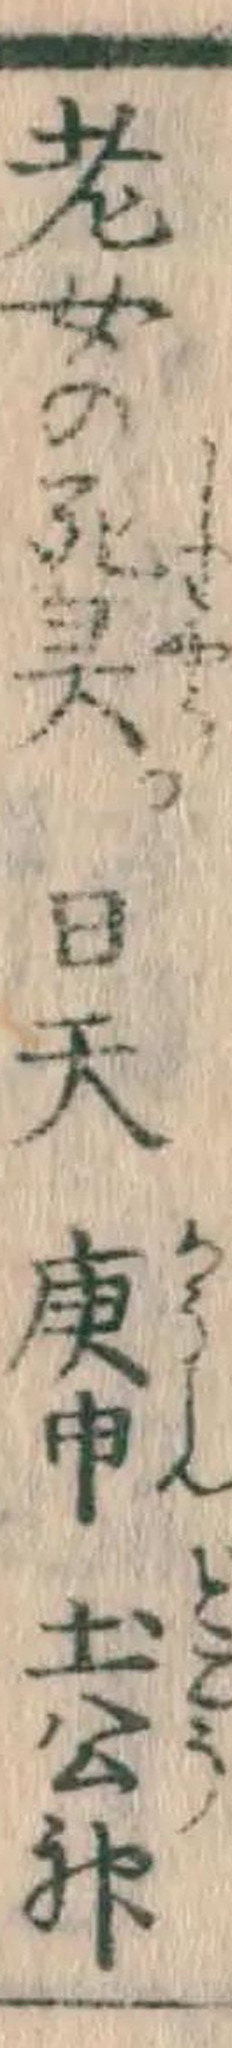老女の死霊。日天庚申土公神
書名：広益秘事大全 3巻. [1]
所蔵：国立国会図書館 National Diet Library, JAPAN
